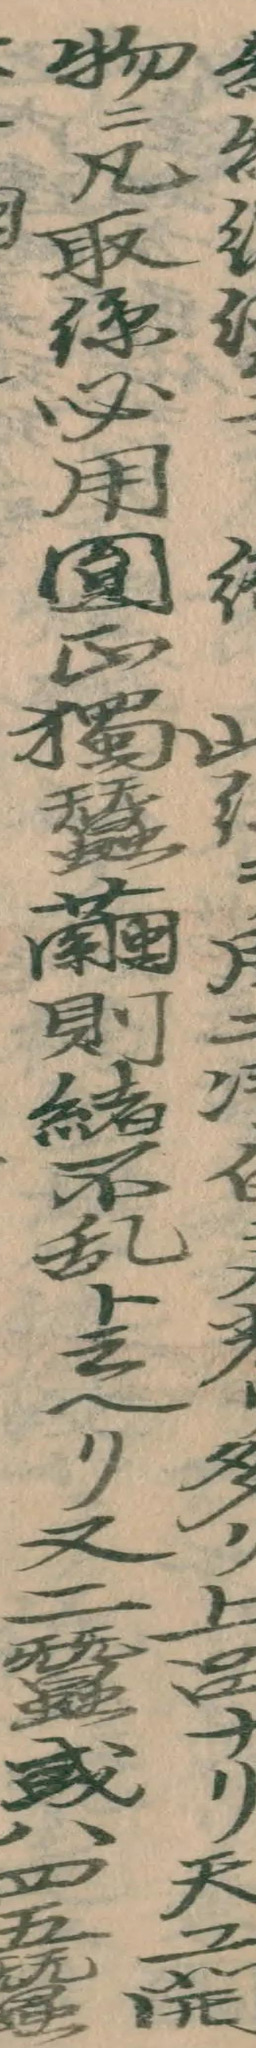物ニ凡取絲必用圓正獨蠶繭則緒不乱ト云ヘリ又ニ蠶或ハ四五蠶
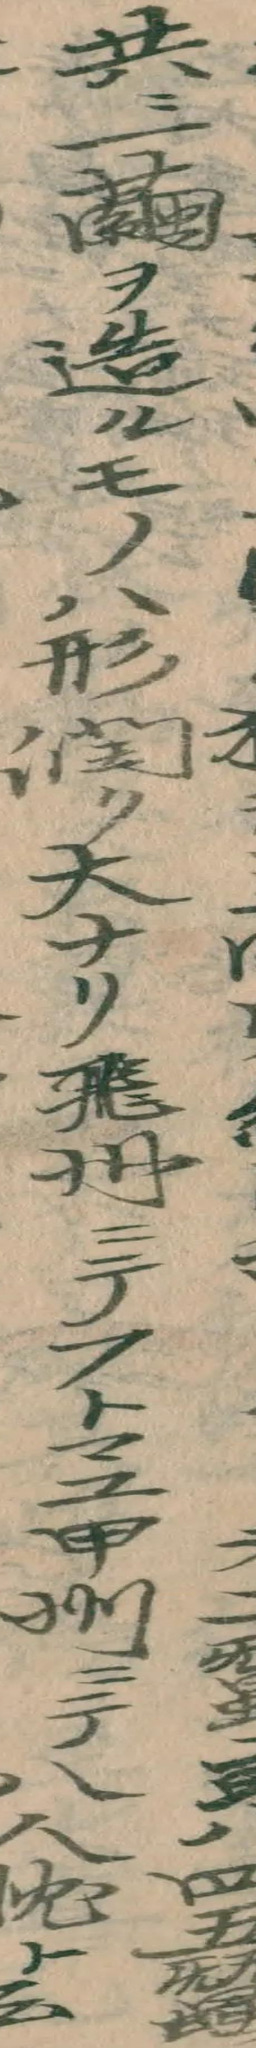共ニ一繭ヲ造ルモノハ形潤ク大ナリ飛州ニテフトマユ甲州ニテ八人枕ト云
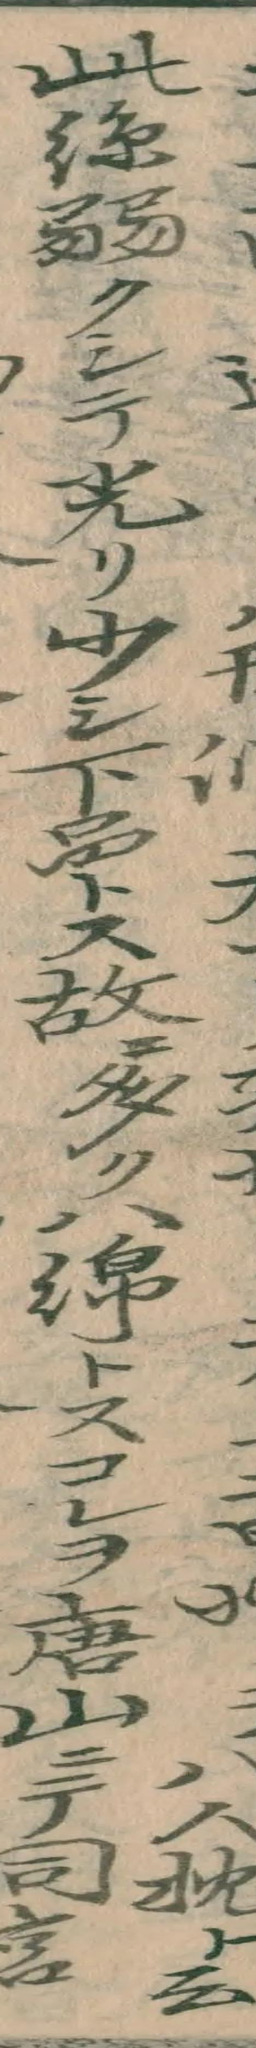此絲弱クシテ光リ少シ下品トス故ニ多クハ綿トスコレヲ唐山ニテ同宮
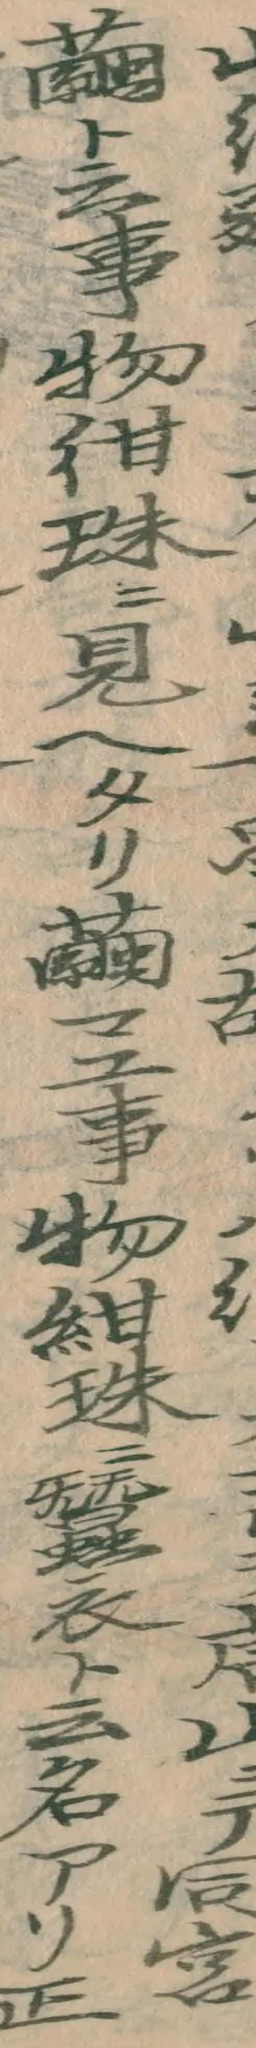繭ト云事物紺珠ニ見ヘタリ繭マユ事物紺珠ニ蠶衣ト云名アリ正
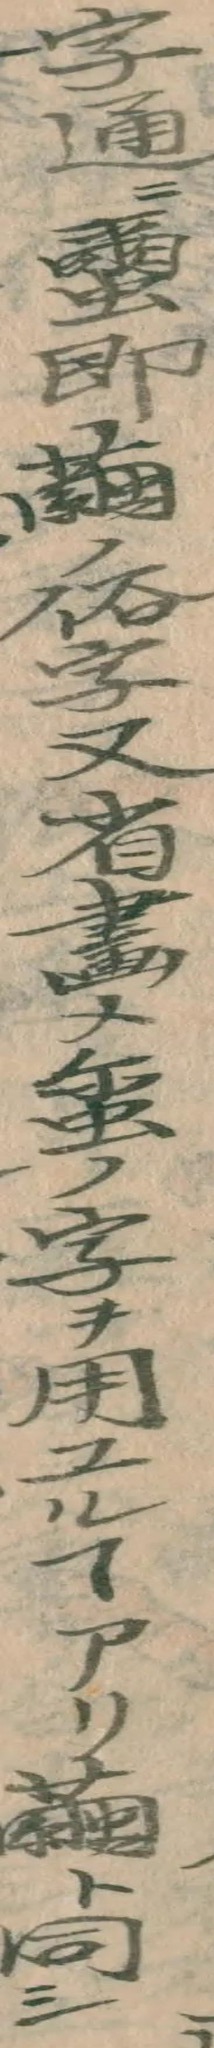字通ニ蠒即繭ノ俗字又省畵シテ𫊱ノ字ヲ用ユルコトアリ繭ト同シ
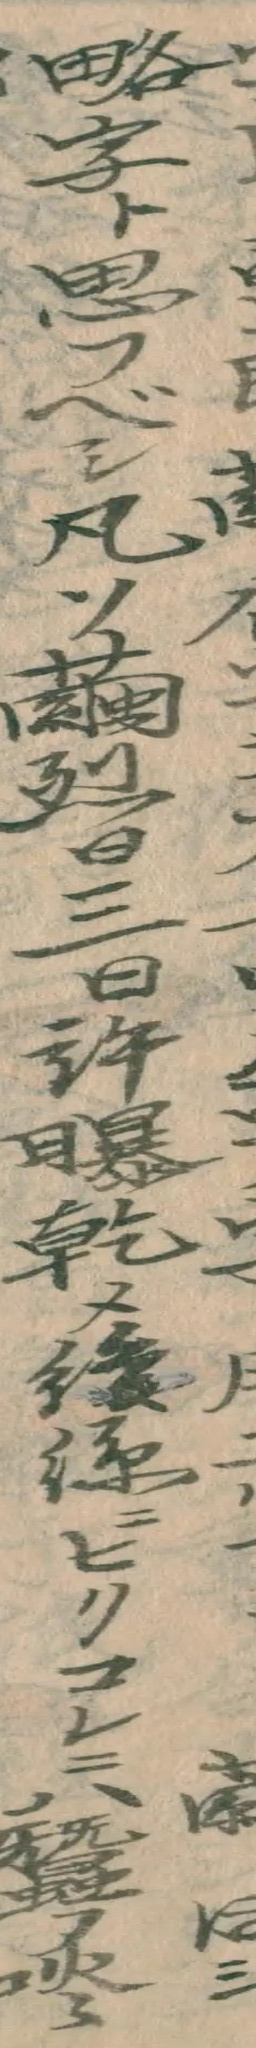略字ト思フベシ凡ソ繭烈日三日許曝乾シテ後絲ニヒクコレニハ蠶ノ啖
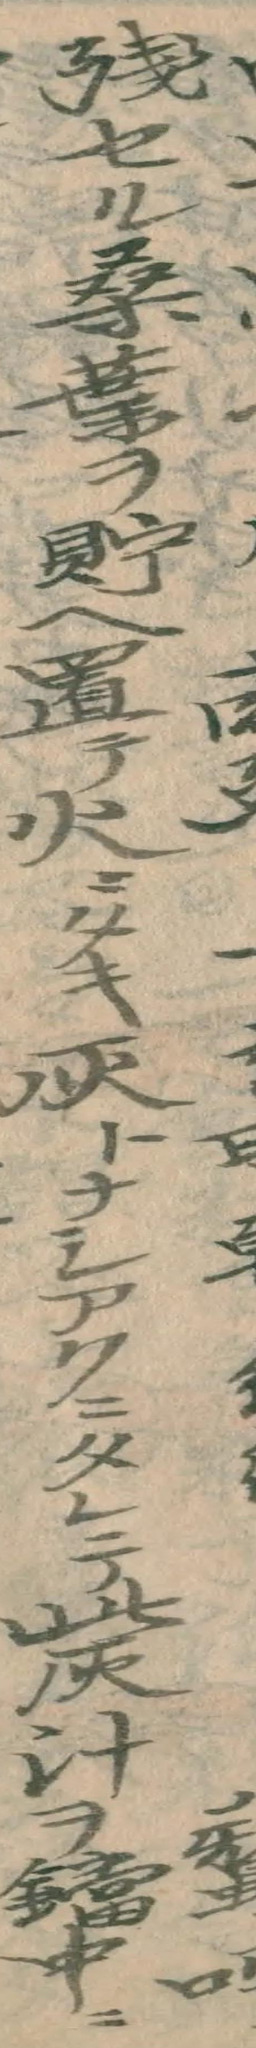残セル桑葉ヲ貯ヘ置テ火ニタキ灰トナシアクニタレテ此灰汁ヲ鐺中ニ
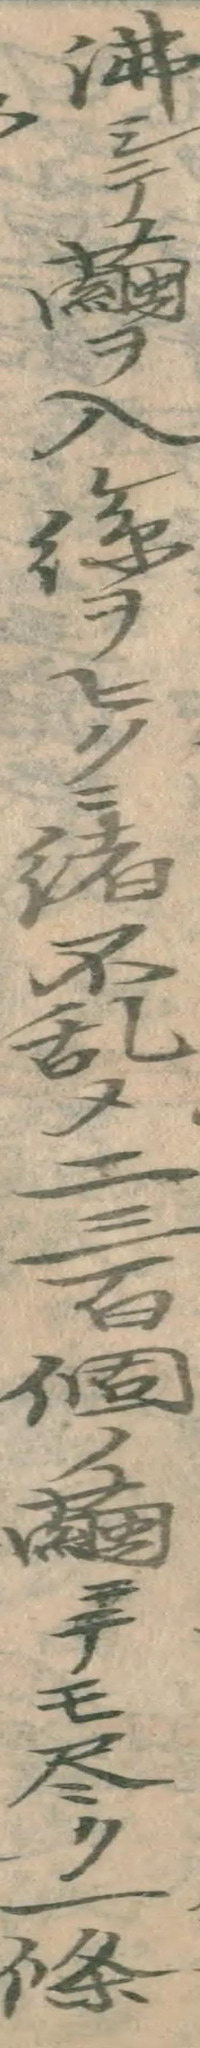沸シテ繭ヲ入レ絲ヲヒクニ緒不乱シテ二三百個ノ繭ニテモ尽ク一條
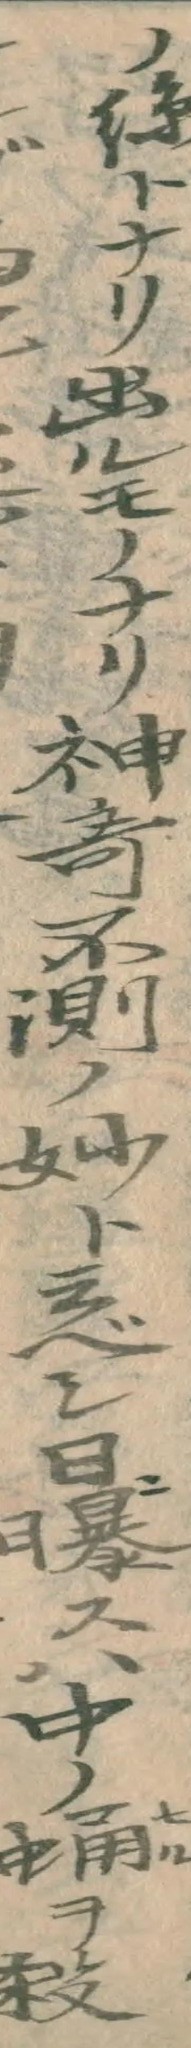ノ絲トナリ出ルモノナリ神奇不測ノ妙ト云ベシ日ニ曝スハ中ノ蛹ヲ殺
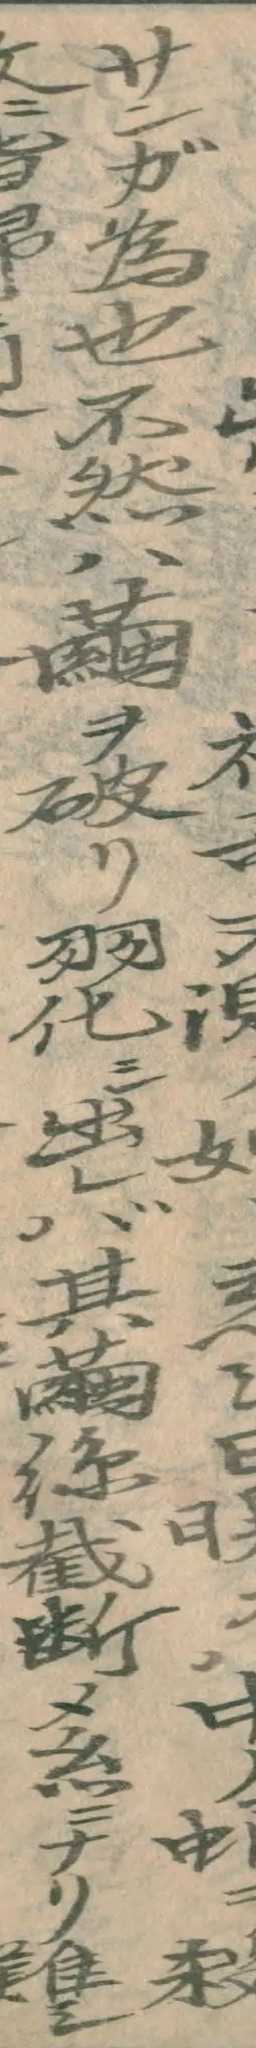サンガ為也不然ハ繭ヲ破リ羽化シ出レバ其繭絲截断シテ糸ニナリ難シ
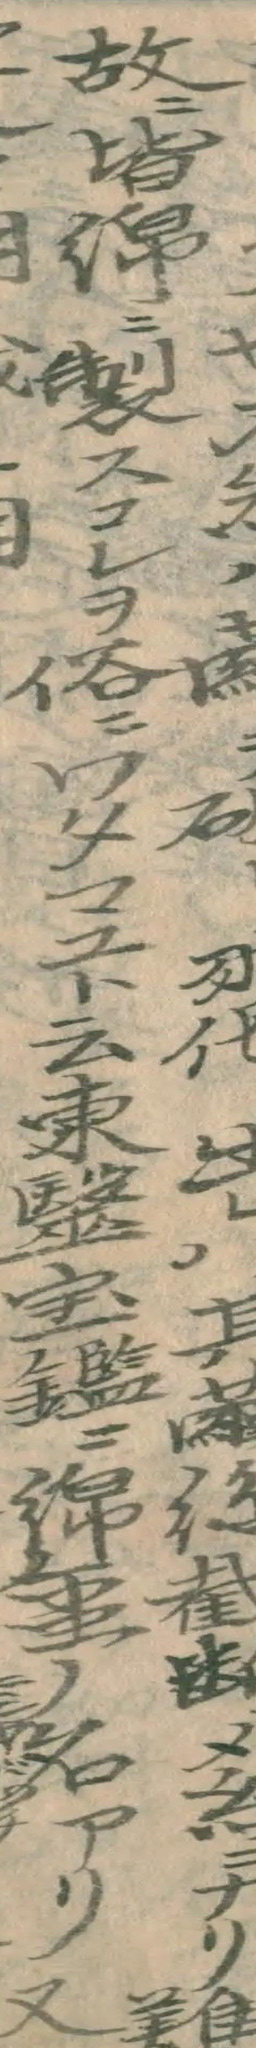故ニ皆綿ニ製スコレヲ俗ニワタマユト云東毉宝鑑ニ綿𫊱ノ名アリ又
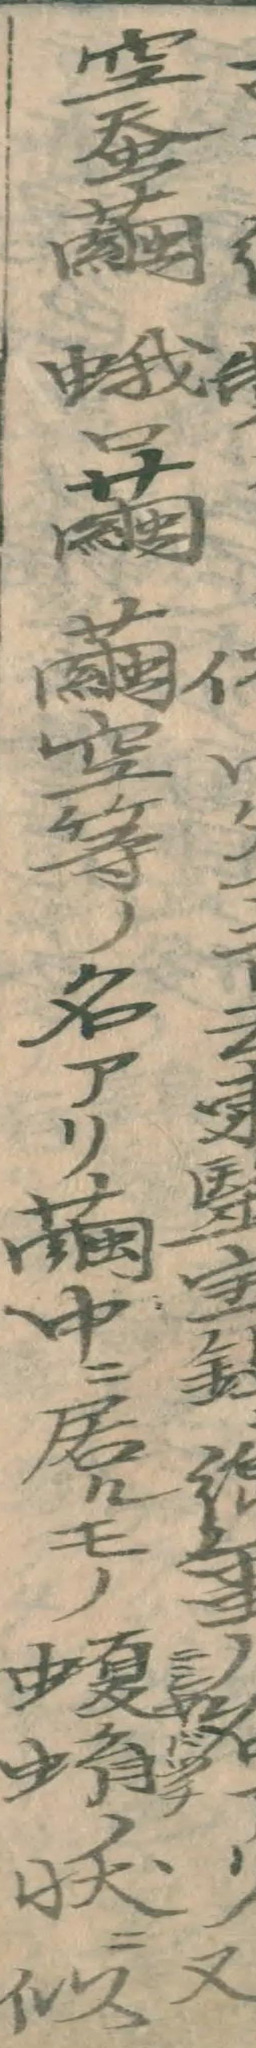空蚕繭蛾口繭繭空等ノ名アリ繭中ニ居ルモノ蝮蜟ノ状ニ似

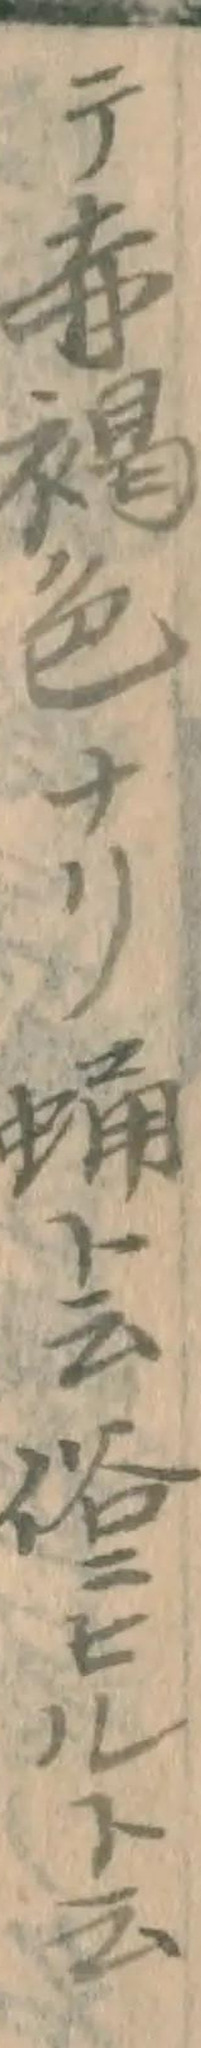テ赤褐色ナリ蛹ト云俗ニヒルト云
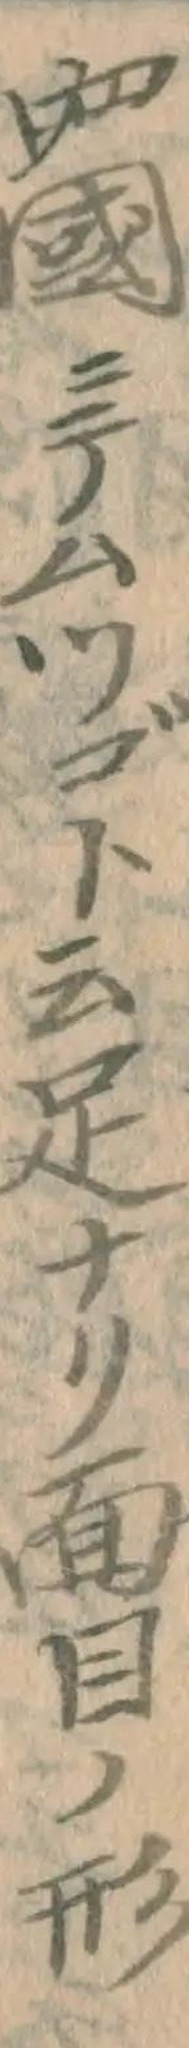四國ニテムツゴト云足ナリ面目ノ形
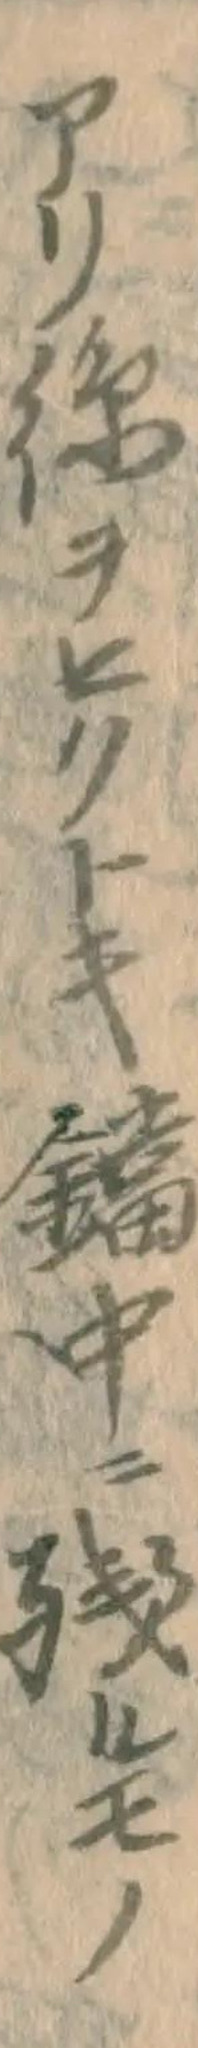アリ絲ヲヒクトキ鐺中ニ残ルモノ
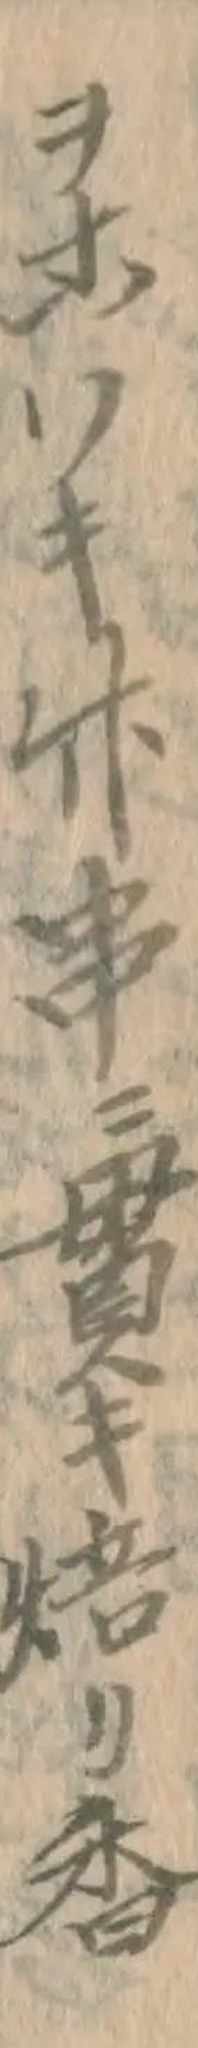ヲホソキ竹串ニ貫キ焙リ香
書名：千蟲譜 3巻. [1]
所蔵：国立国会図書館 National Diet Library, JAPAN
